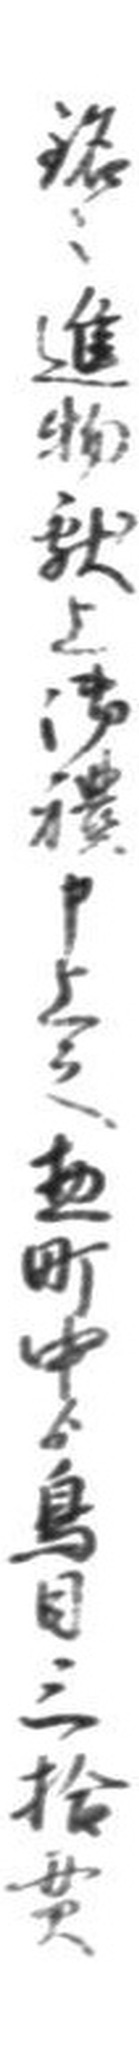銘々進物献上御礼申上之惣町中ゟ鳥目三拾貫
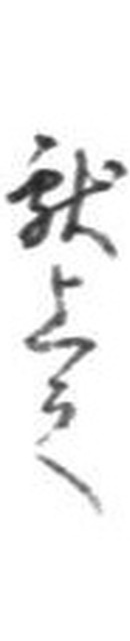献上之
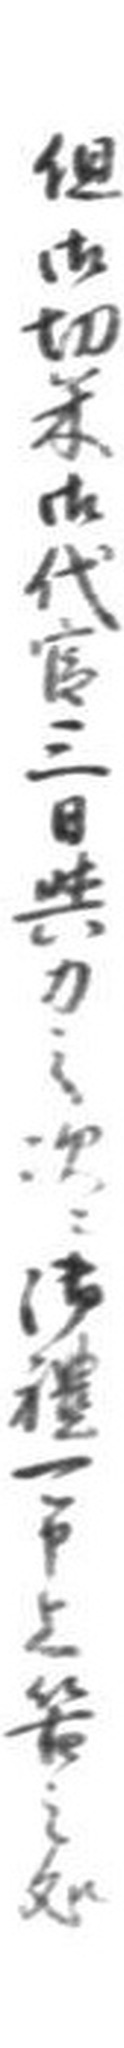但御切米御代官三日与力之次ニ御礼可申上筈之処
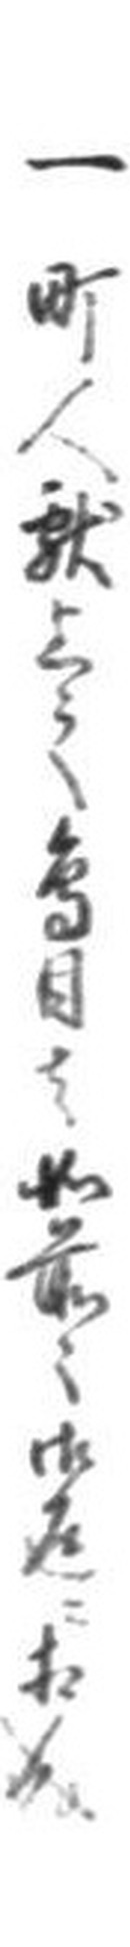一町人献上之鳥目は如前々御返ニ相成
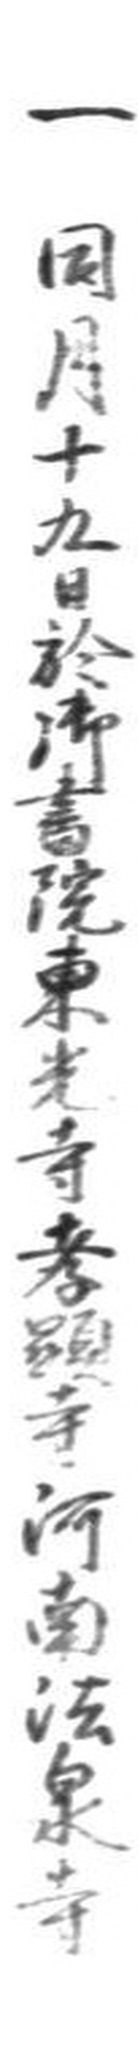一同月十九日於御書院東光寺孝顕寺河南法泉寺
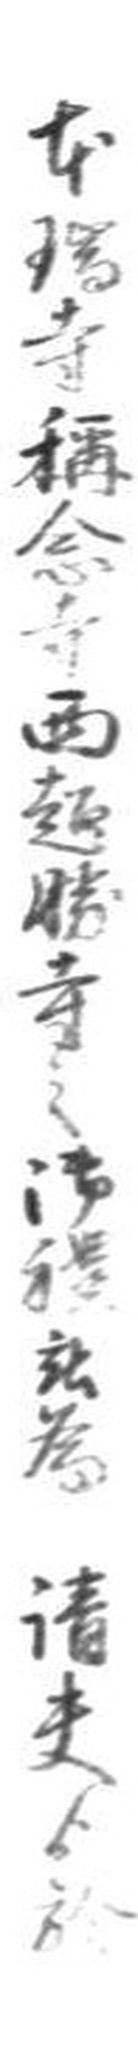本瑞寺称念寺西超勝寺之御礼被為請夫ゟ於
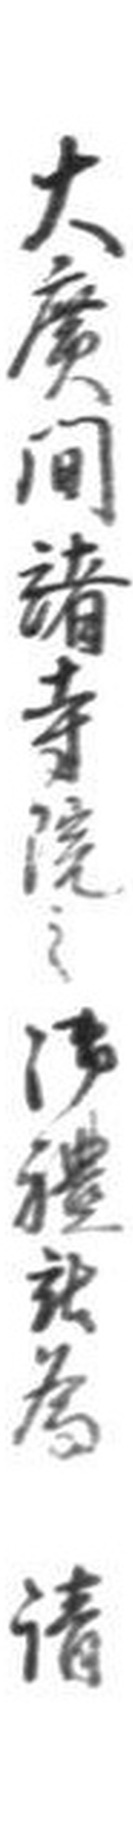大広間諸寺院之御礼被為請

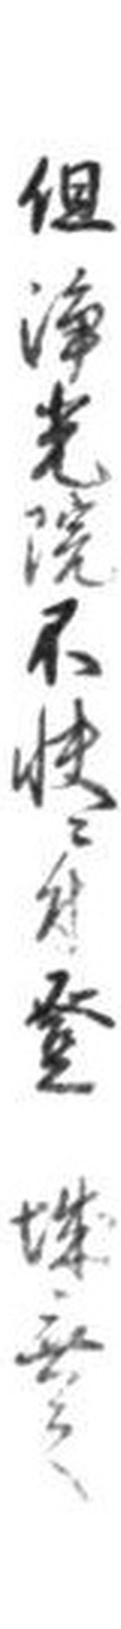但浄光院不快ニ付登城無之
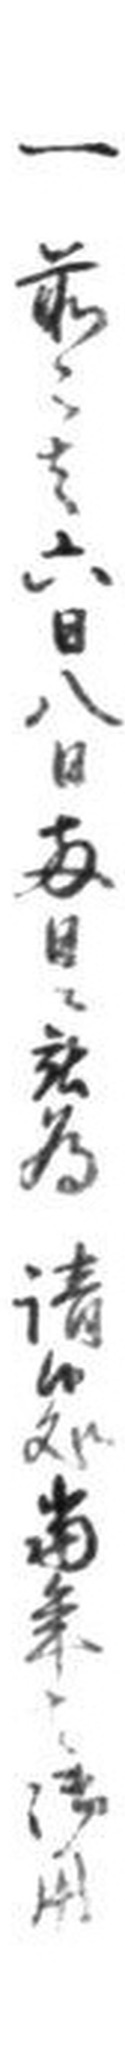一前々は六日八日両日ニ被為請候処当年は御用
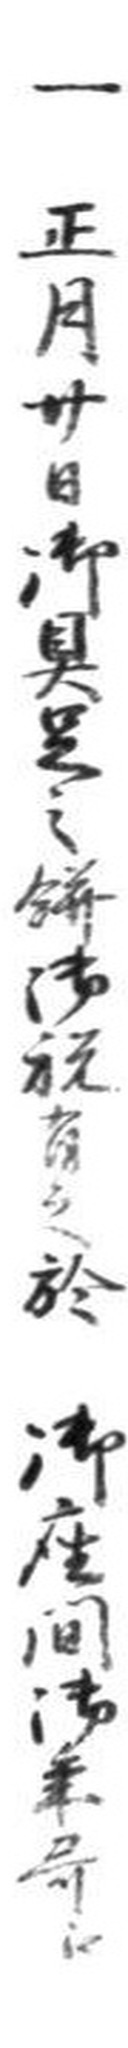一正月廿日御具足之餅御祝有之於御座間御年寄江
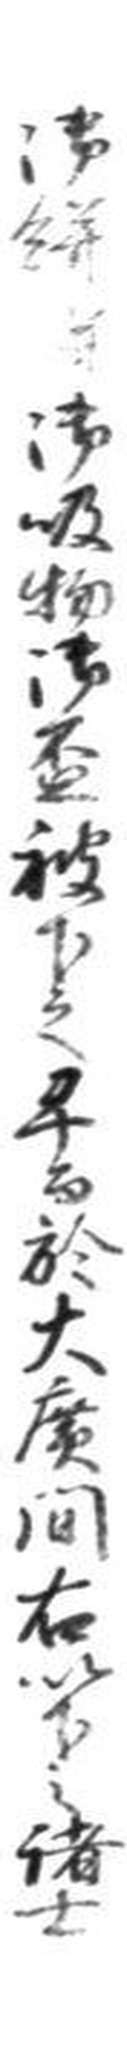御餅并御吸物御盃被下之畢而於大広間右以下之諸士
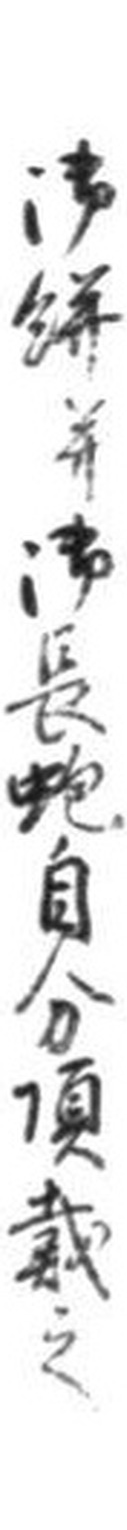御餅并御長蚫自分頂戴之
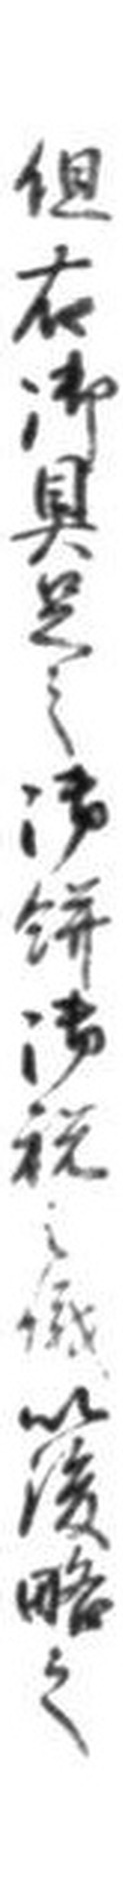但右御具足之御餅御祝之儀以後略之
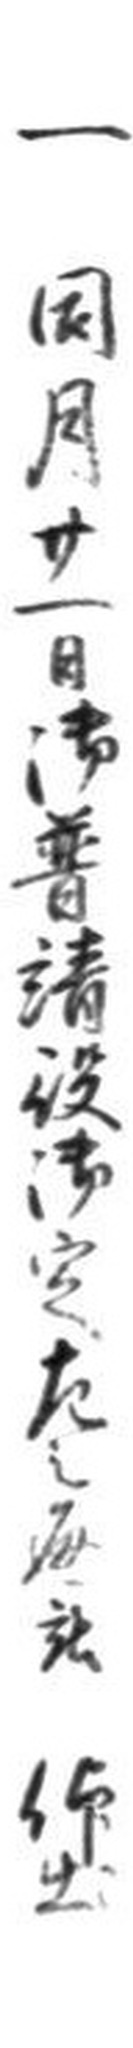一同月廿一日御普請役御定左之通被仰出
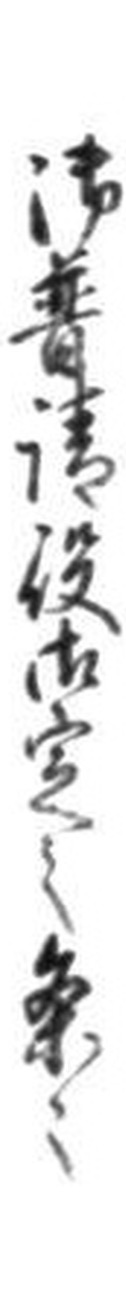御普請役御定之条々
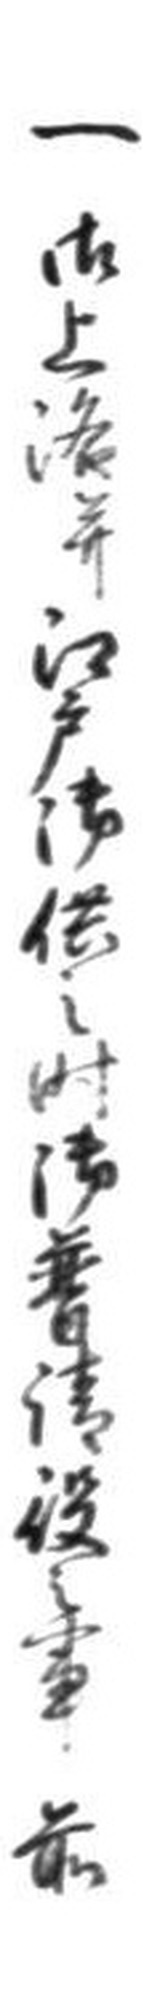一御上洛并江戸御供之時御普請役之事前
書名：家譜 三 忠昌公 従慶長八年到寛永六年
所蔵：福井県文書館 Fukui Prefectural Archives
